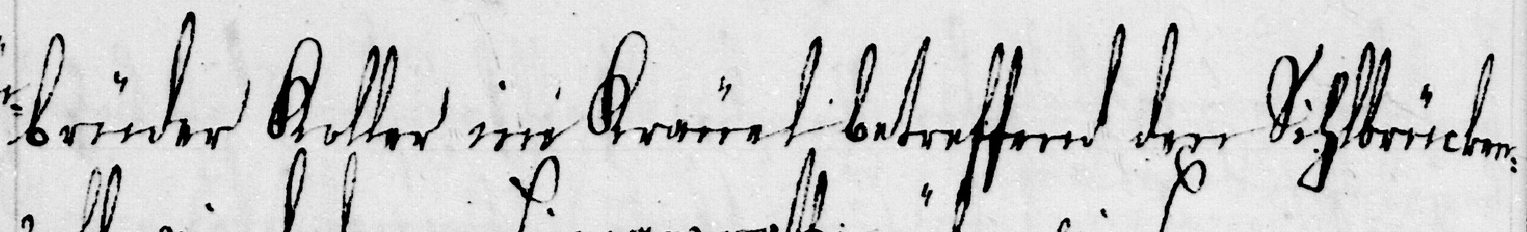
brüder Keller im Kräuel betreffend
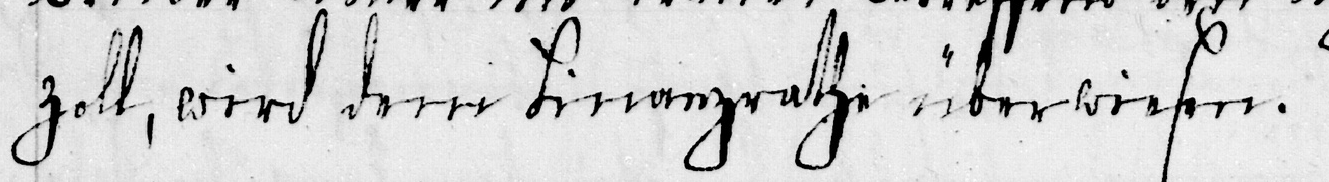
zoll, wird dem Finanzrathe überwiesen.
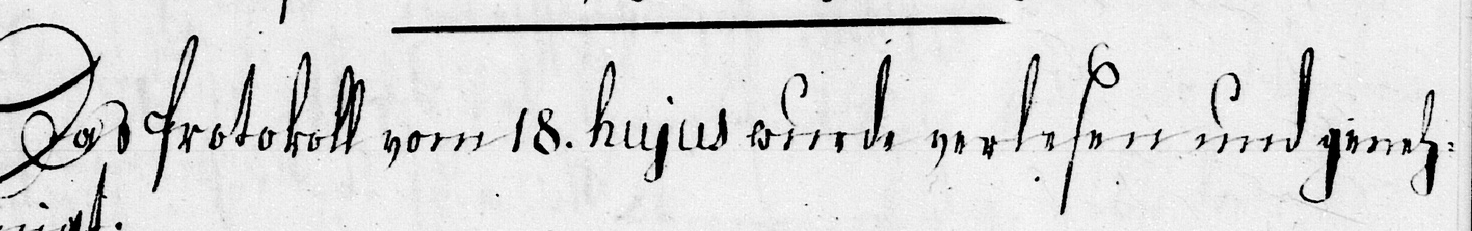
Das Protokoll vom 18. hujus wurde verlesen und geneh¬
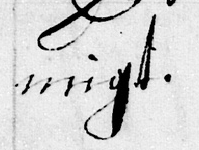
migt.
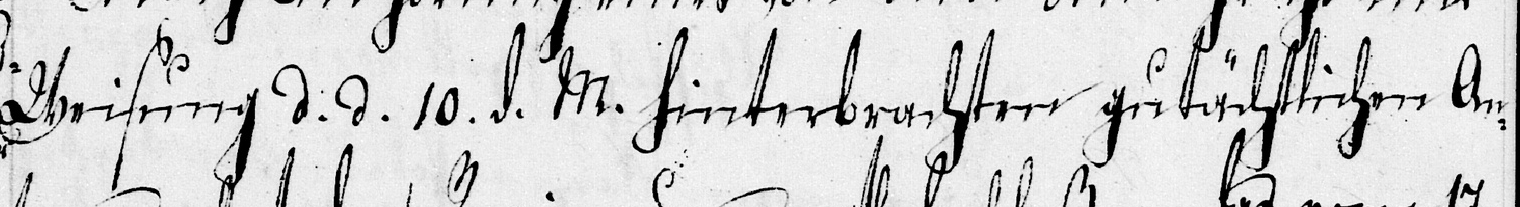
Weisung d. d. 10. d. M. hinterbrachten gutächtlichen A¬
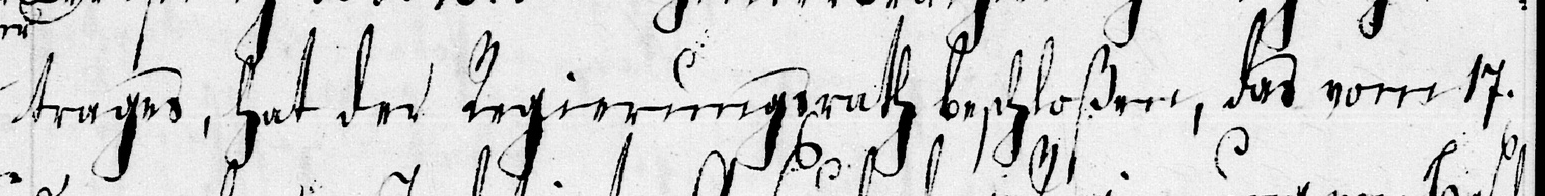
ntrages, hat der Regierungsrath beschloßen, das vom 17.
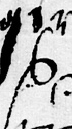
M.
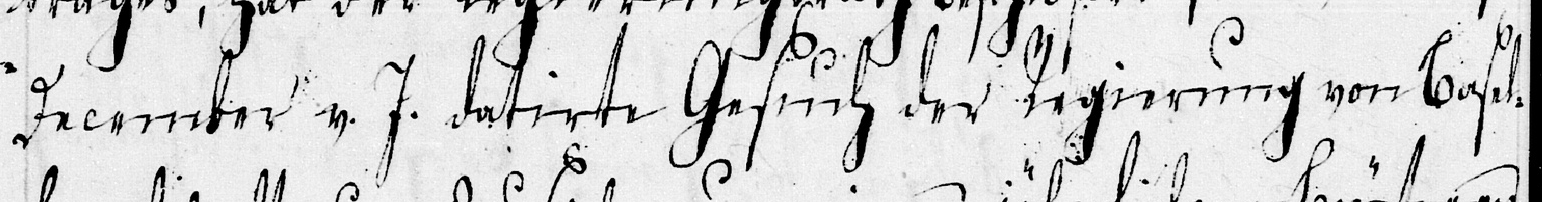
December v. J. datirte Gesuch der Regierung von Base¬
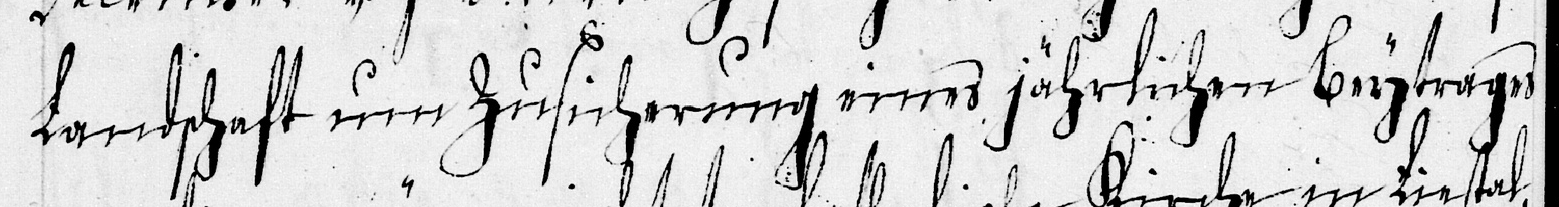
andschaft um Zusicherung eines jährlichen Beytrages
